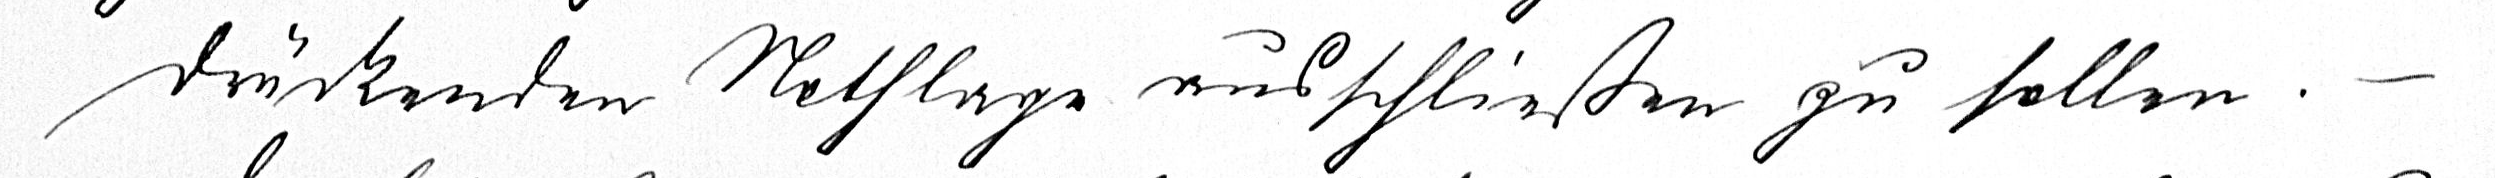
drückenden Nothlage ausschließen zu sollen. —
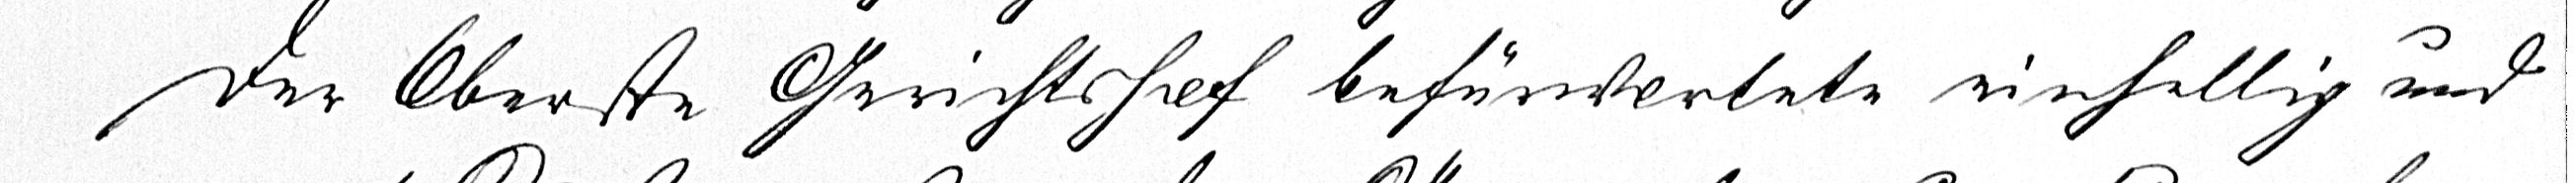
Der Oberste Gerichtshof befürwortete einhellig und
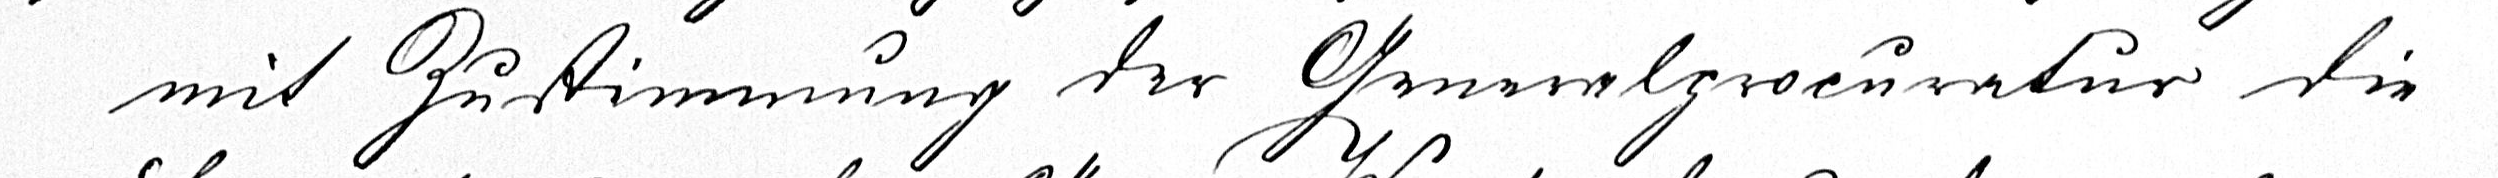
mit Zustimmung der Generalprocuratur die
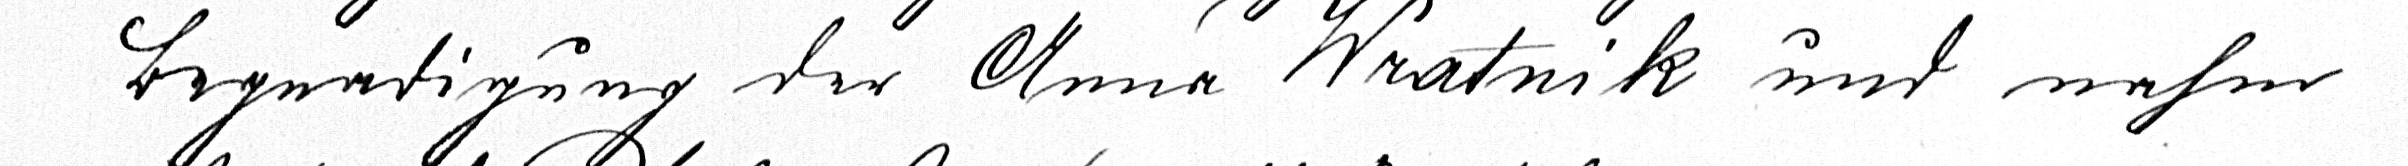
Begnadigung der Anna Wratnik und nahm
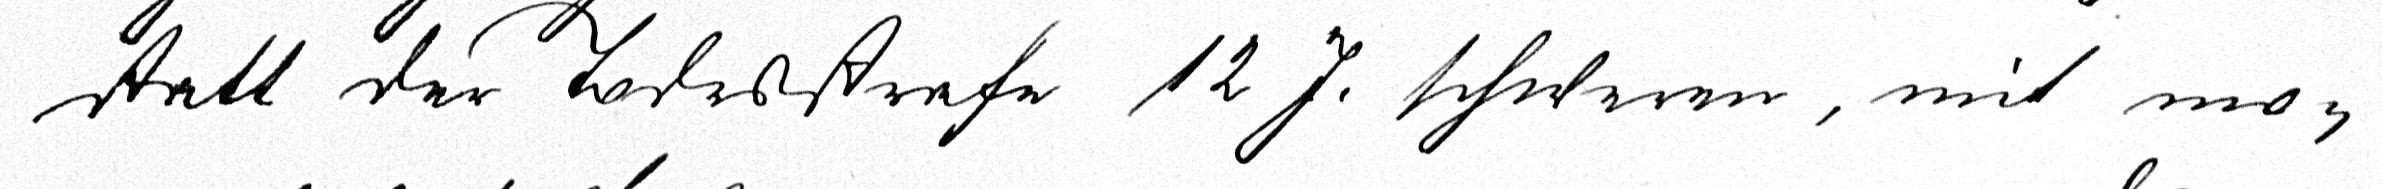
statt der Todesstrafe 12 J. schweren, mit mo¬
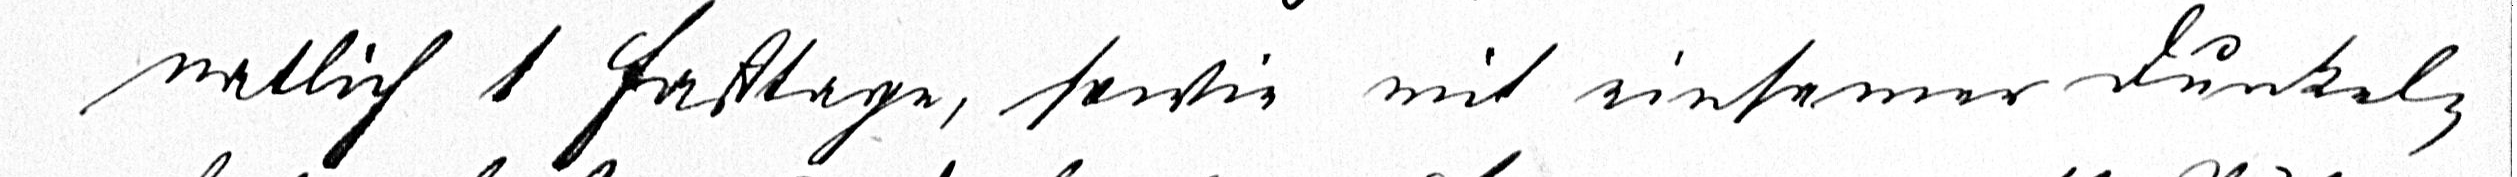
natlich 1 Fasttage, sowie mit einsamer Dunkel¬
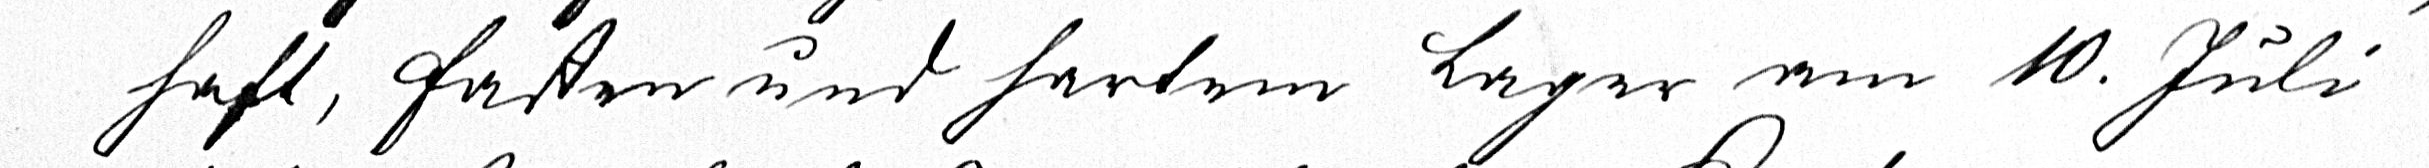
haft, Fasten und hartem Lager am 10. Juli
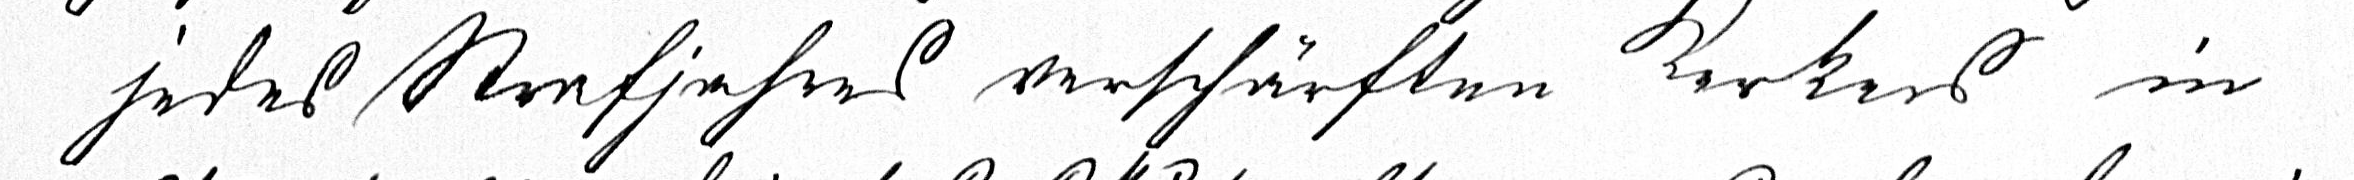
jedes Strafjahres verschärften Kerkers in
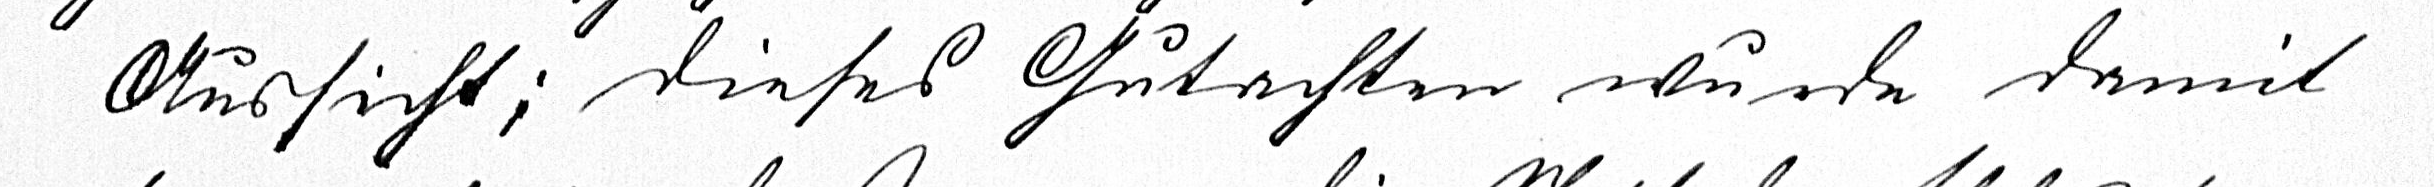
Aussicht; dieses Gutachten wurde damit
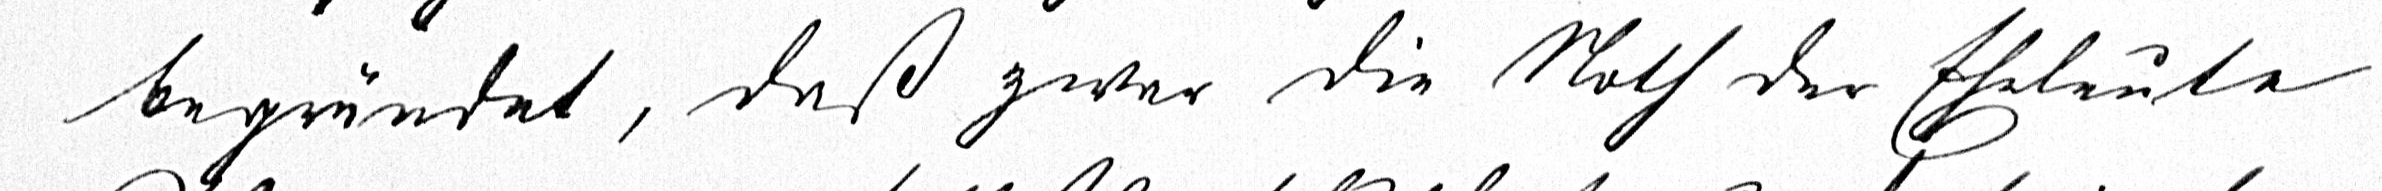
begründet, daß zwar die Noth der Eheleute
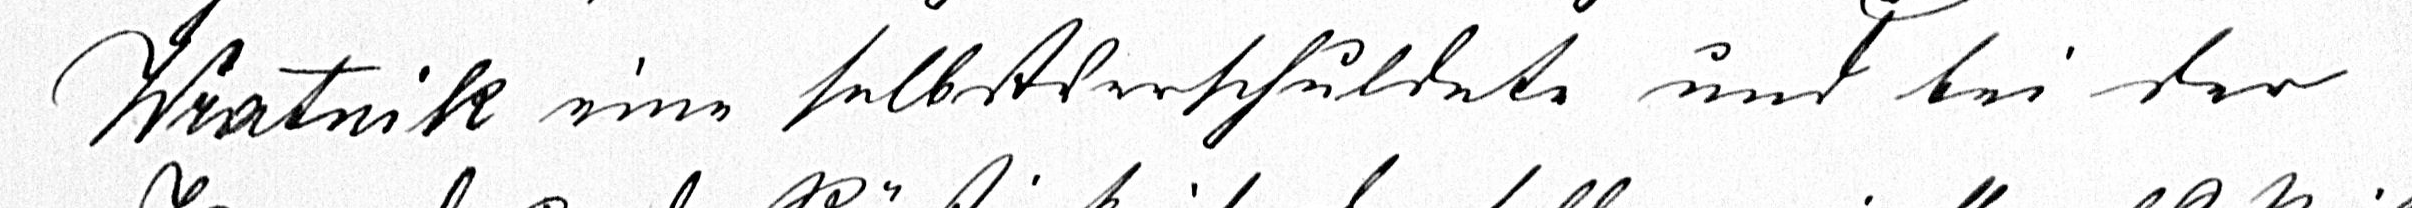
Wratnik eine selbstverschuldete und bei der
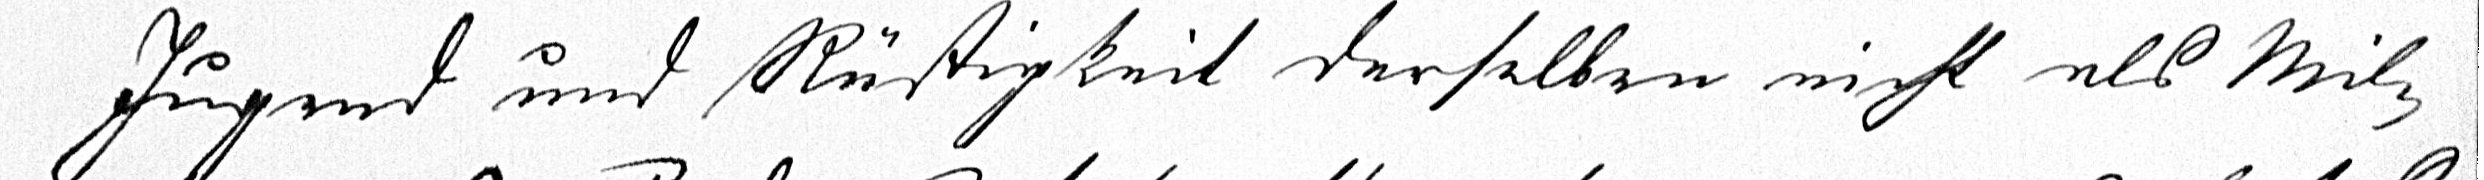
Jugend und Rüstigkeit derselben nicht als Mil¬
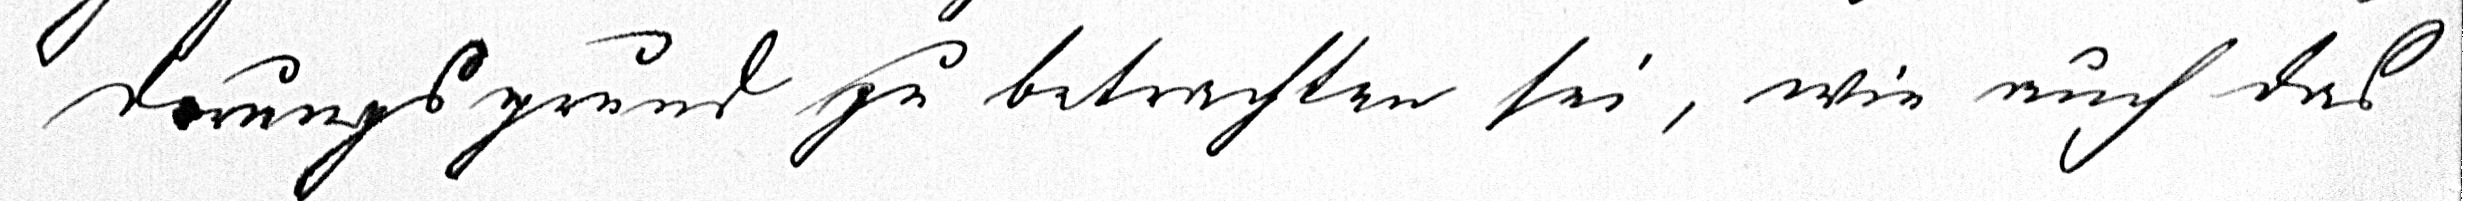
derungsgrund zu betrachten sei, wie auch das
